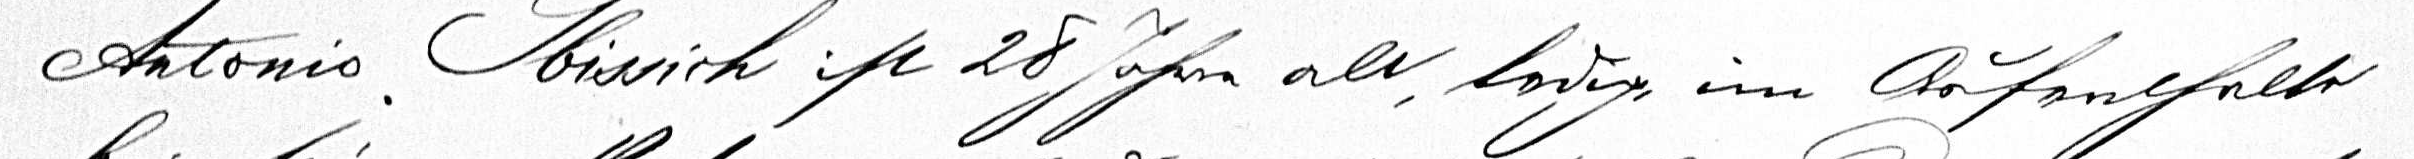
Antonio Sbissich ist 28 Jahre alt, ledig, im Aufenthalte
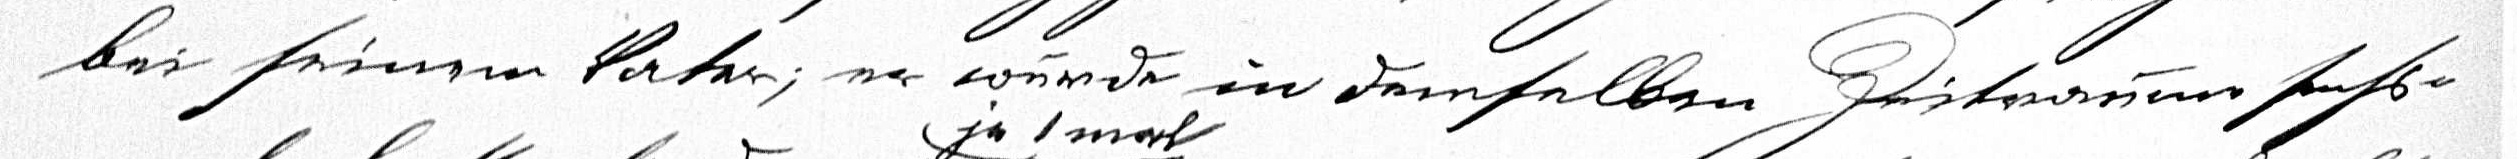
bei seinem Vater; er wurde in demselben Zeitraum sechs¬
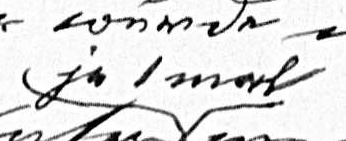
je 1 mal
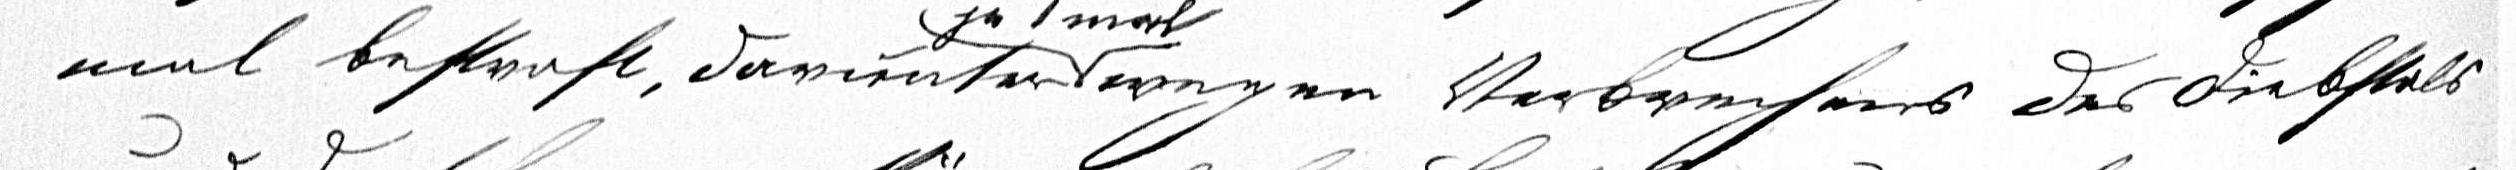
mal bestraft, darunter wegen Verbrechens des Diebstals
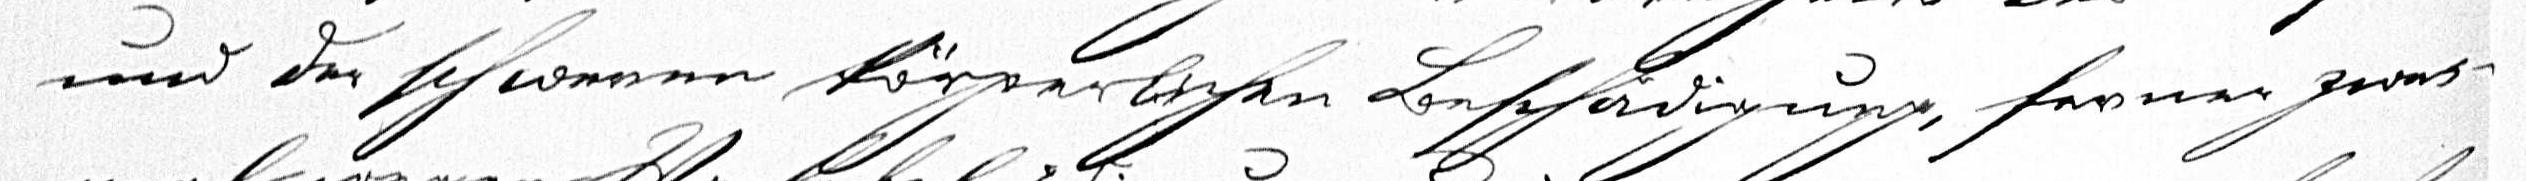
und der schweren körperlichen Beschädigung, ferner zwei¬
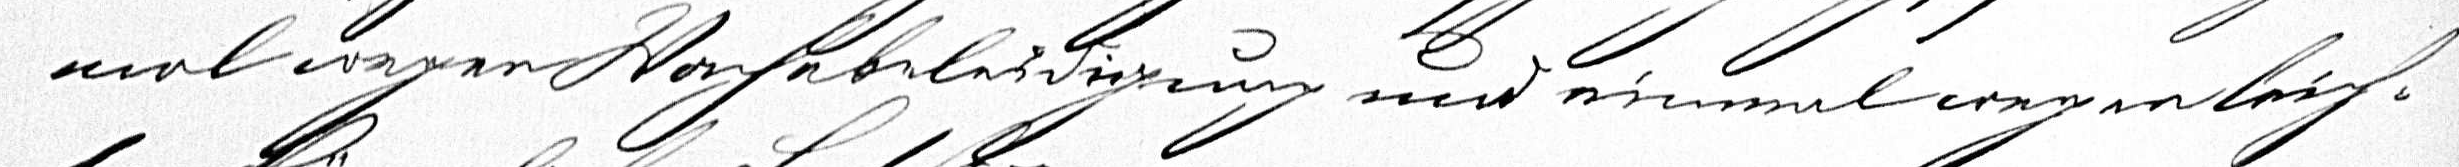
mal wegen Vorhabeleidigung und einmal wegen leich¬
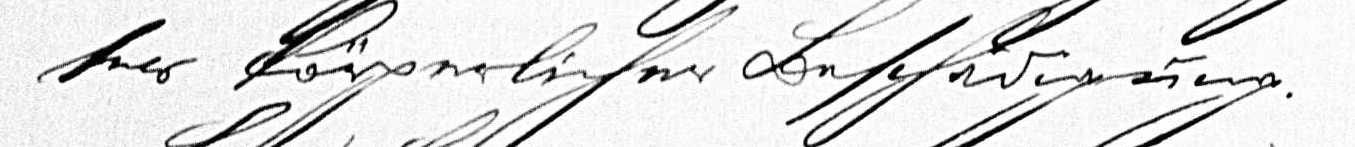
ter körperlicher Beschädigung.
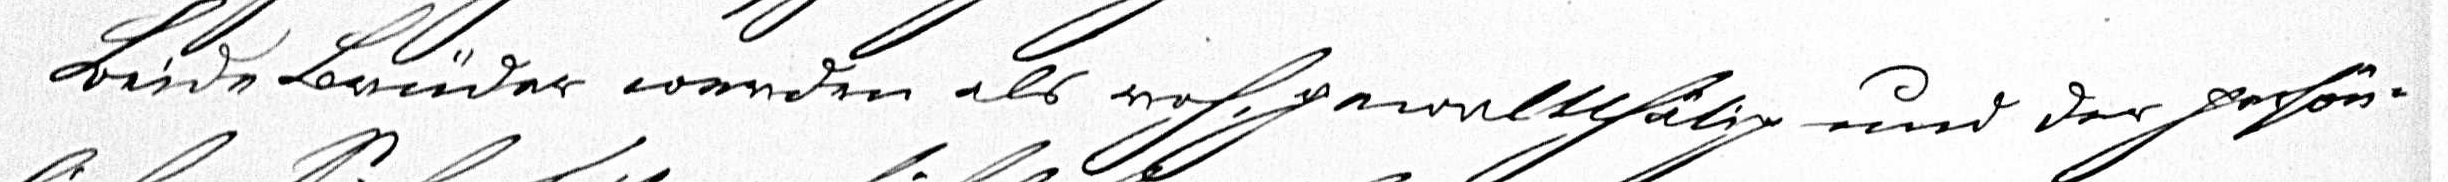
Beide Brüder werden als roh, gewaltthätig und der persön¬
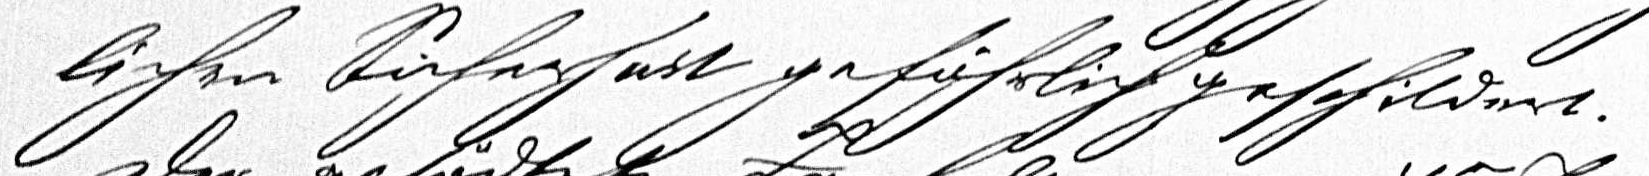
lichen Sicherheit gefährlich geschildert.
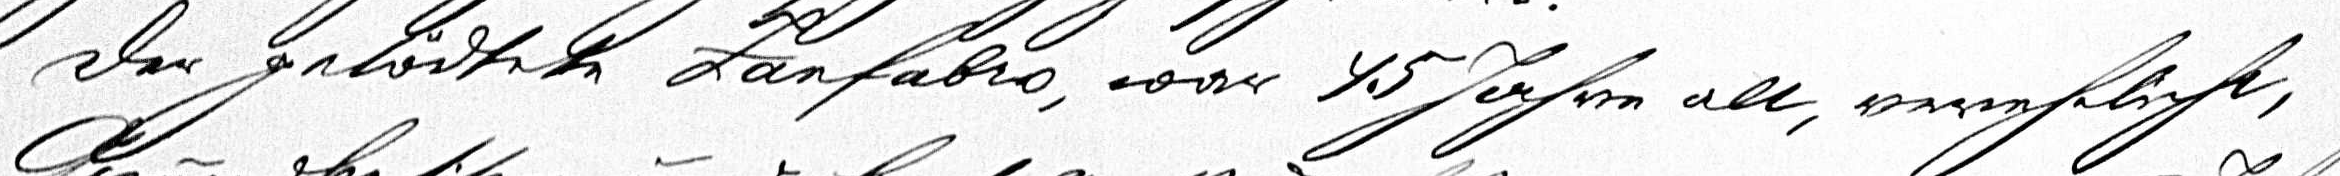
Der getödtete Zanfabro, war 45 Jahre alt, verehelicht,
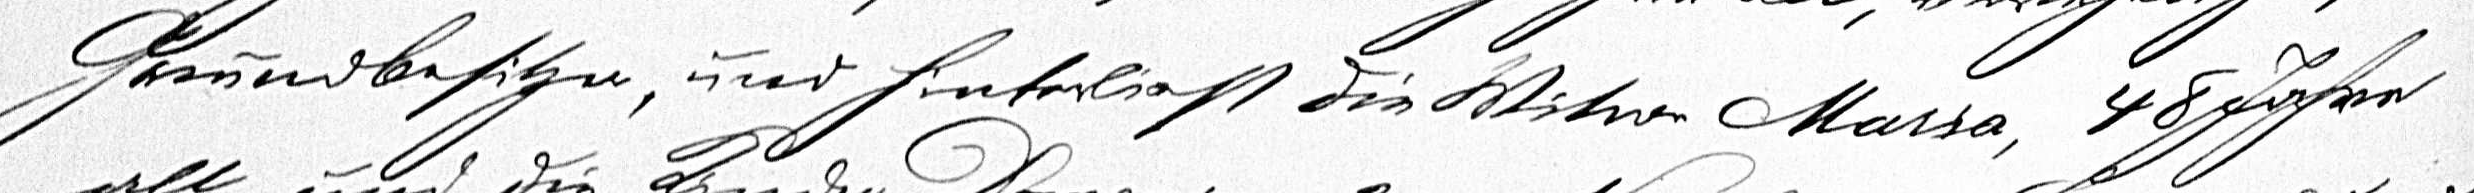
Grundbesitzer, und hinterließ die Witwe Maria, 48 Jahre
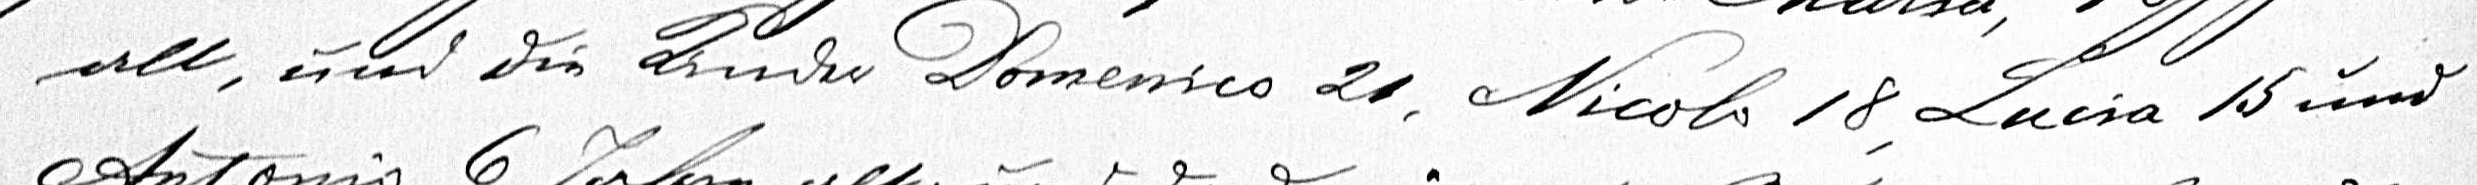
alt und die Kinder Domenico 21, Nicolo 18, Lucia 15 und
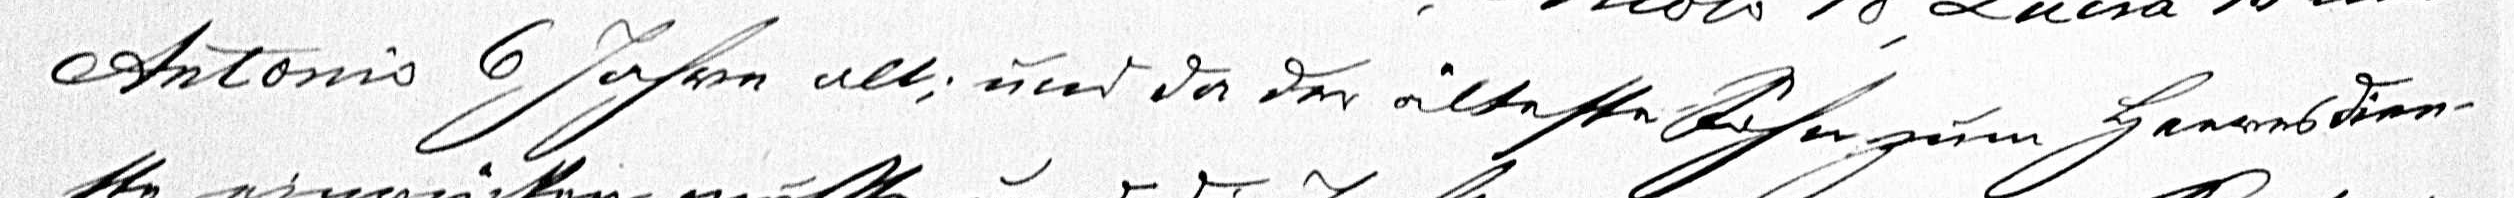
Antonio 6 Jahre alt; und da der älteste Sohn zum Heeresdein¬
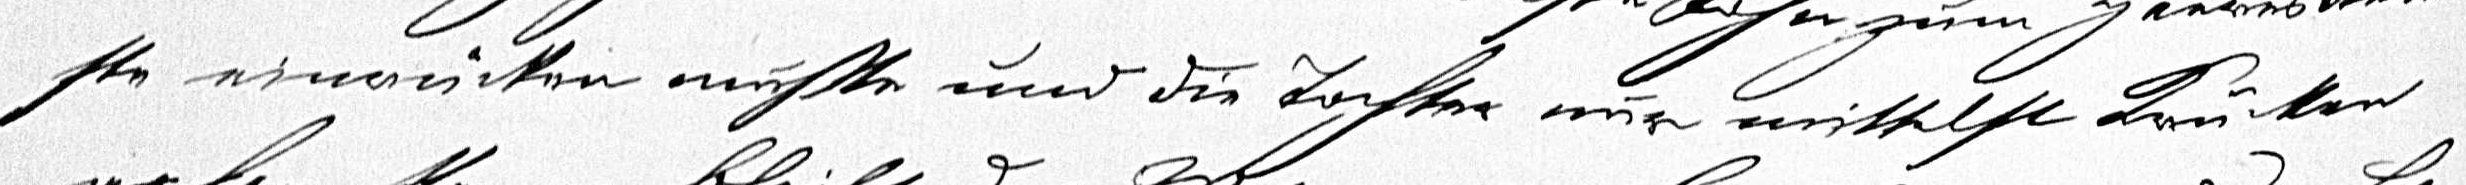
ste einrücken mußte und die Tochter nur mittelst Krücken
